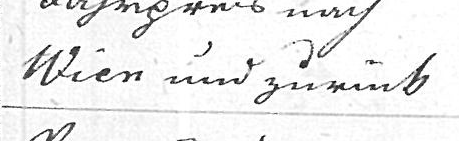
Wien und zurück
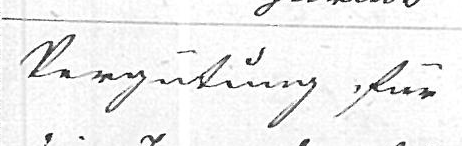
Vergütung für
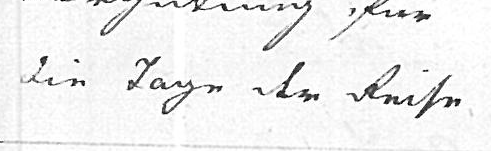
die Tage der Reise
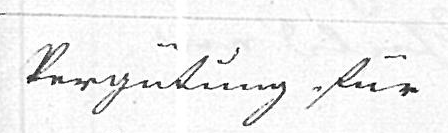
Vergütung für
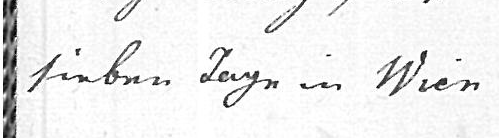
sieben Tage in Wien
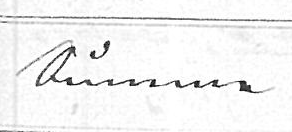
Summe
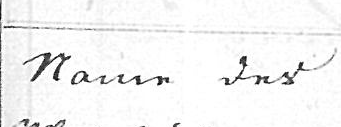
Name des
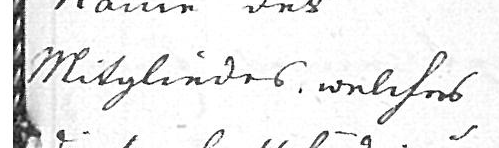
Mitgliedes, welches
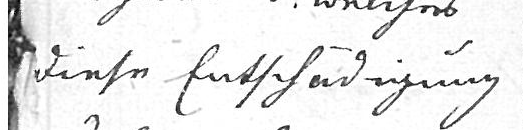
diese Entschädigung
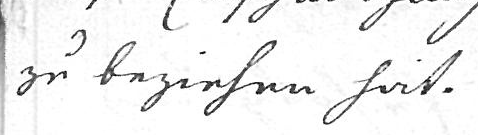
zu beziehen hat.
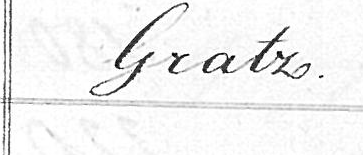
Gratz
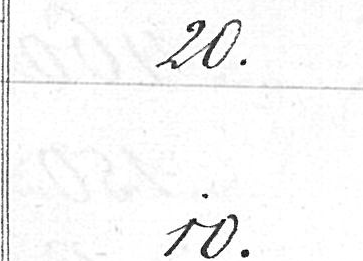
20.
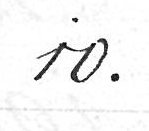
10.
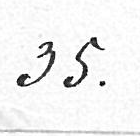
35.
